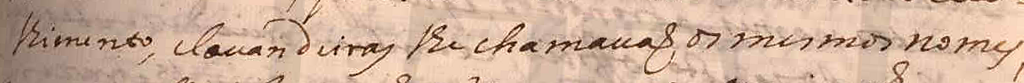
lhimento, e lauandeiras lhe chamauaõ os mesmos nomes,
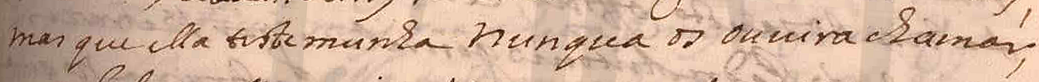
mas que ella testemunha nunqua os ouuira chamar,
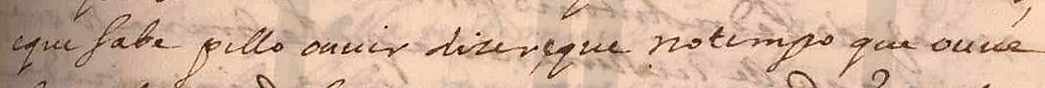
e que sabe pello ouuir dizer, e que no tempo que ouue
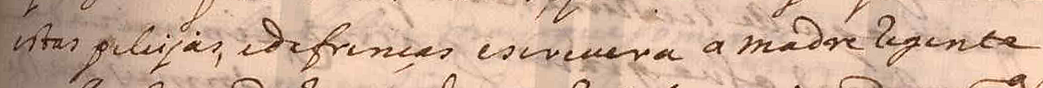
estas peleijas, e defrenças escreuera a madre Regente
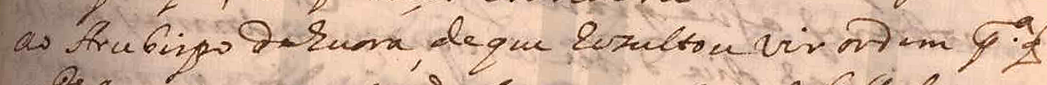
ao Arcebispo de Euora, de que rezultou vir ordem p.a q̄
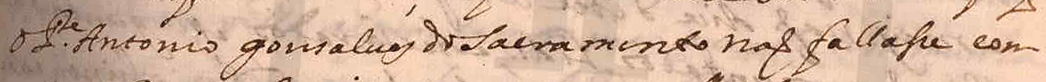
o P.e Antonio gonsalues do Sacramento naõ fallasse com
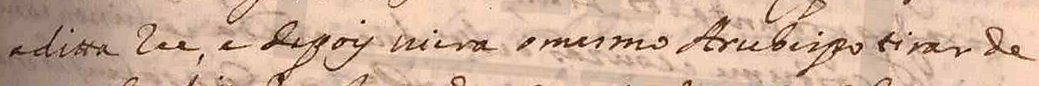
a ditta Ree, e depois uiera o mesmo Arcebispo tirar de
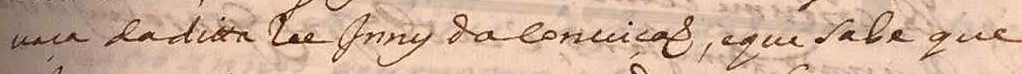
uaça da ditta Ree Jnnes da conceiçaõ, e que sabe que
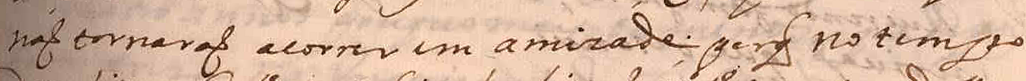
naõ tornaraõ a correr em amizade, porq̄ no tempo
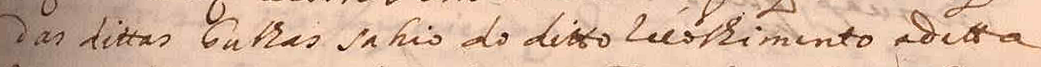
das dittas bulhas sahio do ditto Recolhimento a ditta
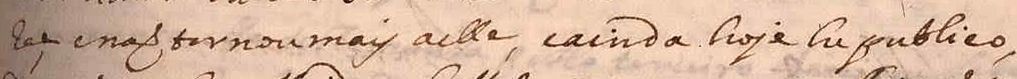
Ree, e naõ tornou mais a elle, e ainda hoje he publico,
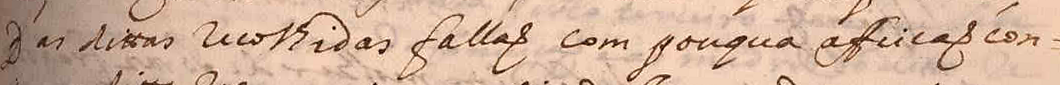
q̄ as dittas Recolhidas fallaõ com pouqua affeiçaõ con
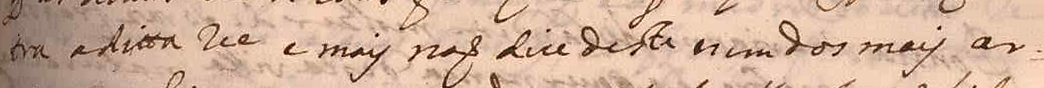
tra a ditta Ree e mais naõ dice deste nem dos mais ar
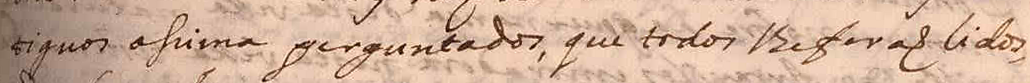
tiguos assima perguntados, que todos lhe foraõ lidos,
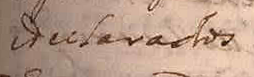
e declarados
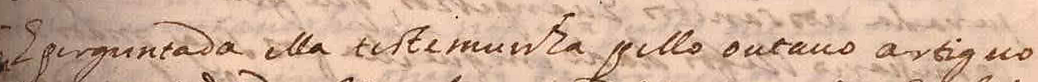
E perguntada ella testemunha pello outauo artiguo
